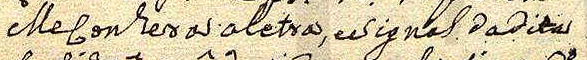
elle Conhera a letra, e signal da dita
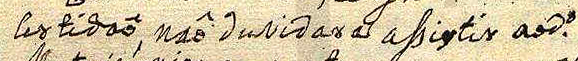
certidaõ naõ duvidara assistir ao d.o
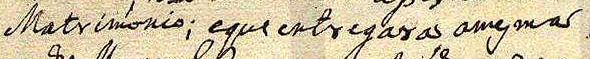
Matrimonio; e que entregara a mesma
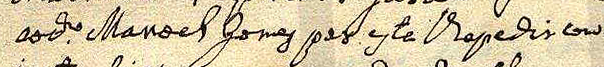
ao d.o Manoel Gomes por este lhe pedir com
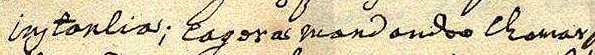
instanCia; e agora mandandoo chamar
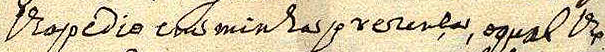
lho pedio com minha prezença, o qual lhe
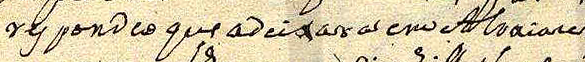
respondeo que a deixara em Alvaiazere
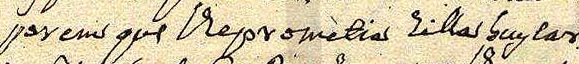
porem que lhe prometia hilla buscar
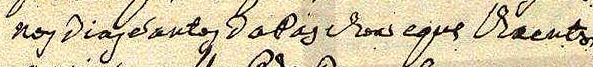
nos dias santos da Paschoa e que lha entre
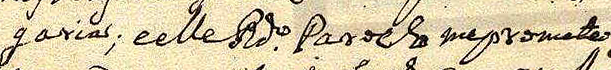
garia; e elle Rd.o Parocho me prometeu
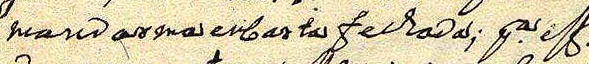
mandarma en Carta fechada; p.a eff.o
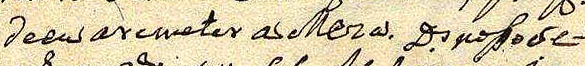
de eu a remeter a Meza. D.s nosso se
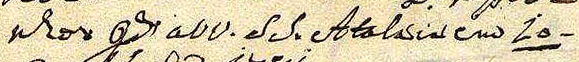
nhor g.de a VV. SS. Atalaia em i0
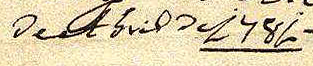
de Abril de i78i
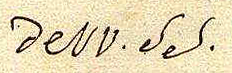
de VV. S.S
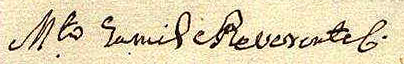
Mto humil e Reverente C.
